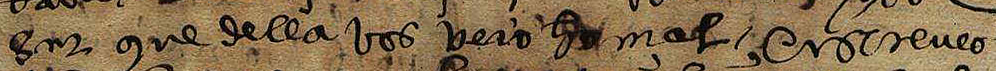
ser que della vos veio ho maL / e escreueo
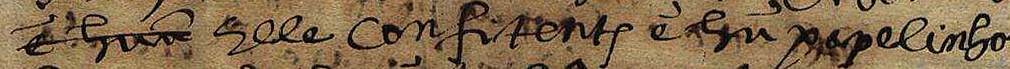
ē huū Elle confitentꝭ ē hū papelinho
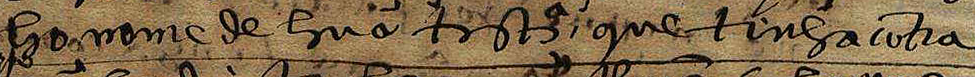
ho nome de huā testa, que tinha cōtra
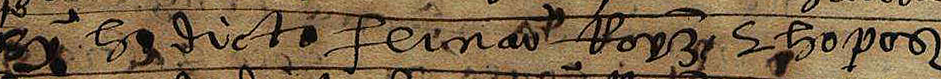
sy ho dicto fernaõ Royz̄ E ho pos
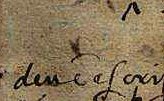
deu ē escripto
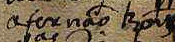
a fernão Rōiz
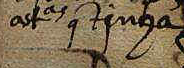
as tas q̄ tjnha
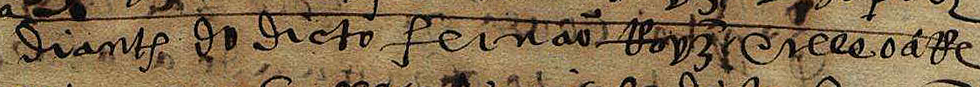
diantꝭ do dicto fernaõ Royz̄ / e elle o aRe
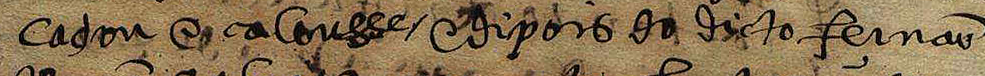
cadou e calousse / e dipois do dicto fernão
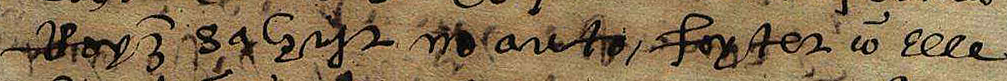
Royz̄ sahyr no auto, foy ter cō Elle
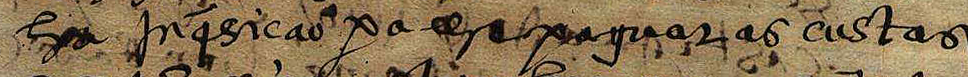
ha Jnq̄siçaõ ꝑa lhe paguar as custas
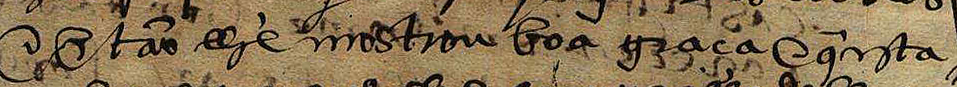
e ētaõ lhe mostrou boa graça e q̄ esta
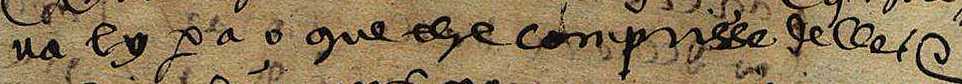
ua ly ꝑa o que lhe comprisse delle / e
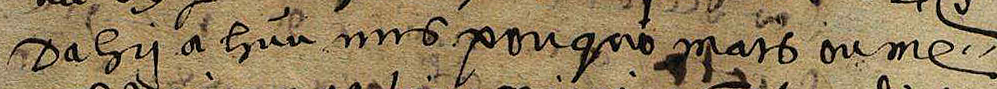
Dahy a hūu mes pouquo mais ou me
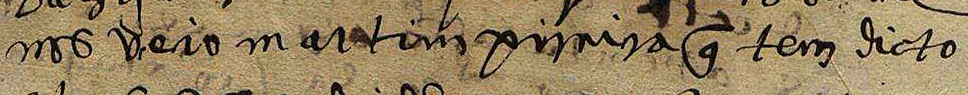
nos veio martim pireira q̄ tem dicto
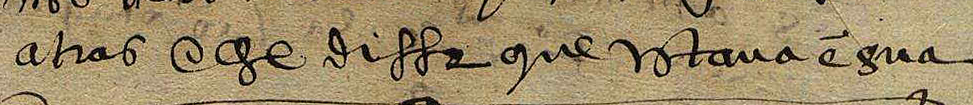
atras e lhe disse que estaua e̅ sua
